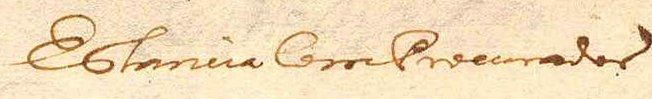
Estancia Com Procurador
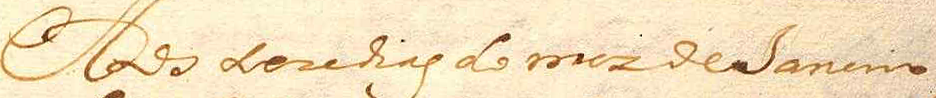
Aos treze dias do mez de Ianeiro
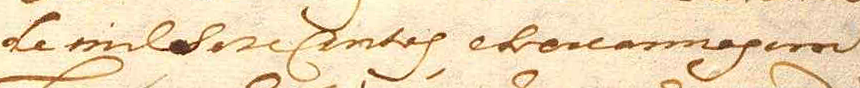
de mil seteCentos, e treze annos em
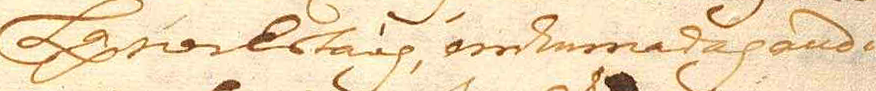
Lxa nos Estaos, em huma das audi
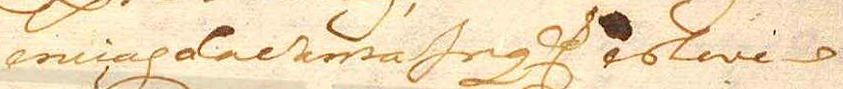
encias da santa Jnqçaõ esteve o
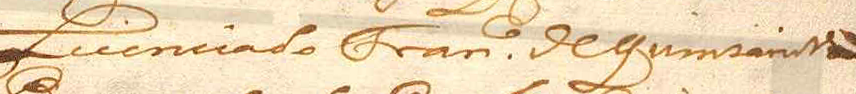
Licenciado Franco de quintanilha
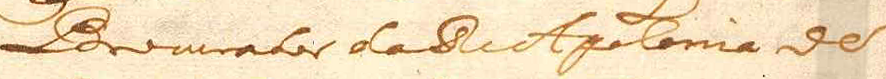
Procurador da Re Apolonia de
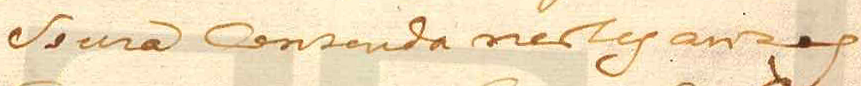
Souza conteuda nestes autos
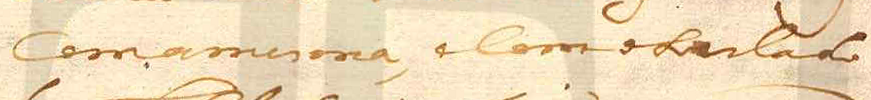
com a mesma, e com o traslado
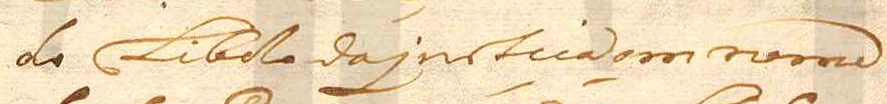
do Libelo da justiça em nome
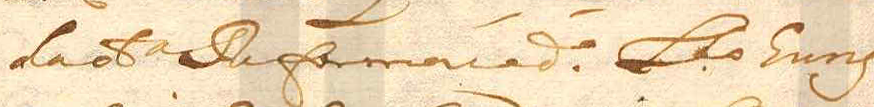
da d̄a Reformou o d.o Ld.o huns
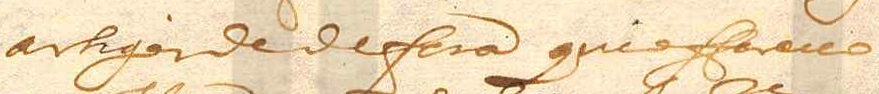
artigos de defeza que offereceo
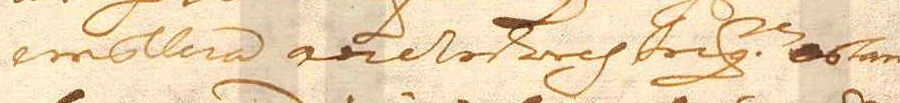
em Meza aos Senhores Inq.res estan
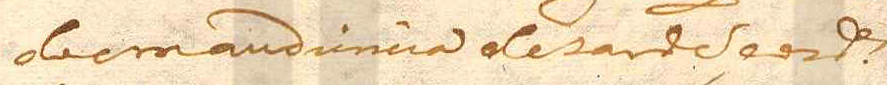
do em audiencia de tarde, e os d.os
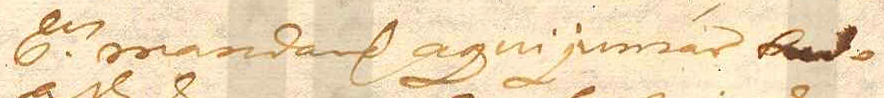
s.res mandarā aqui juntar tudo
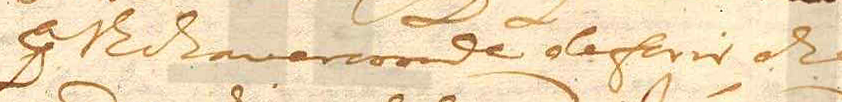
pa lhe haveram de deferir e he
